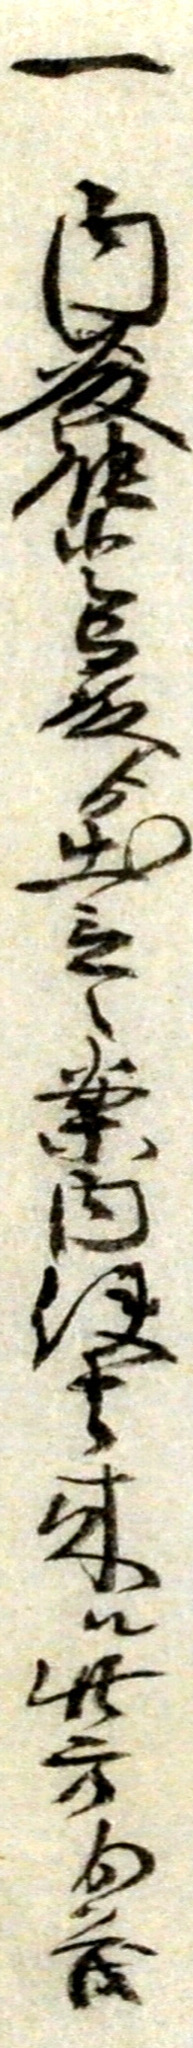一内藤能登守殿ゟ出立之案内使者来ㇽ此方ゟ茂
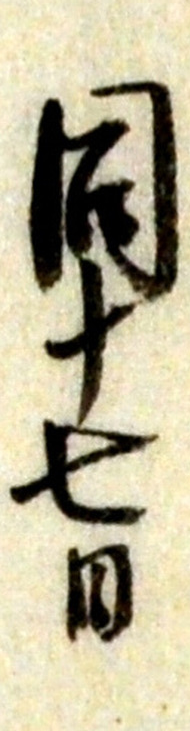同十七日
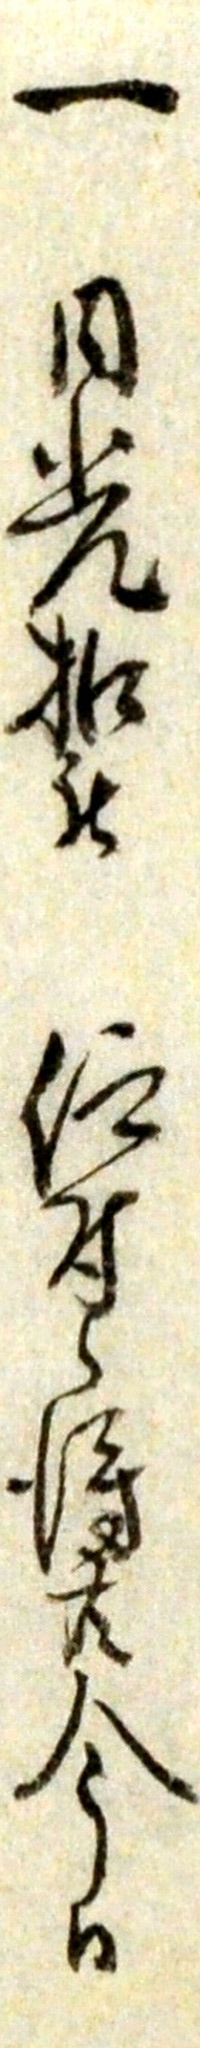一日光扣被仰付候得共今日
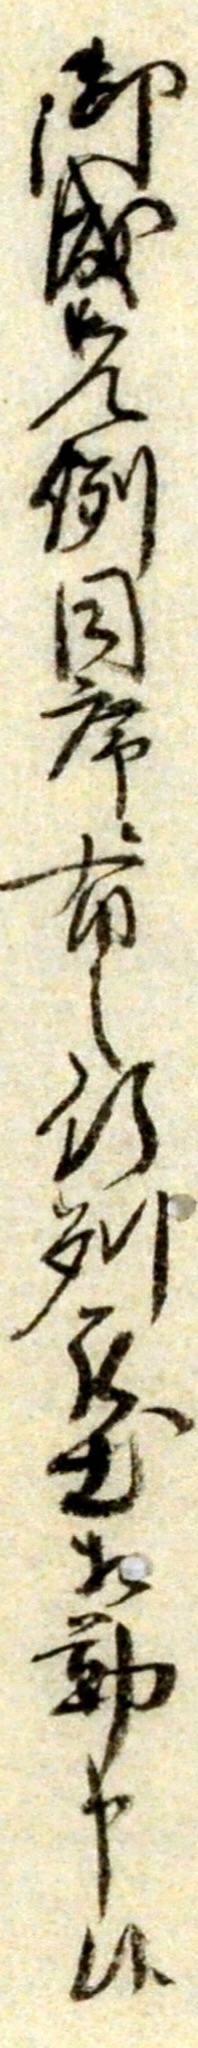御成先例同席ニ有之行列罷出相勤申候
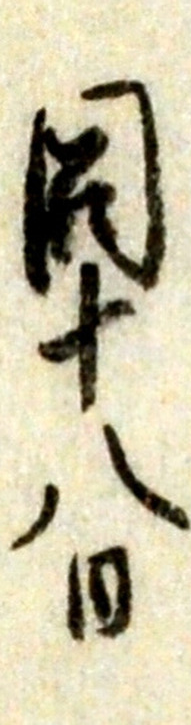同十八日
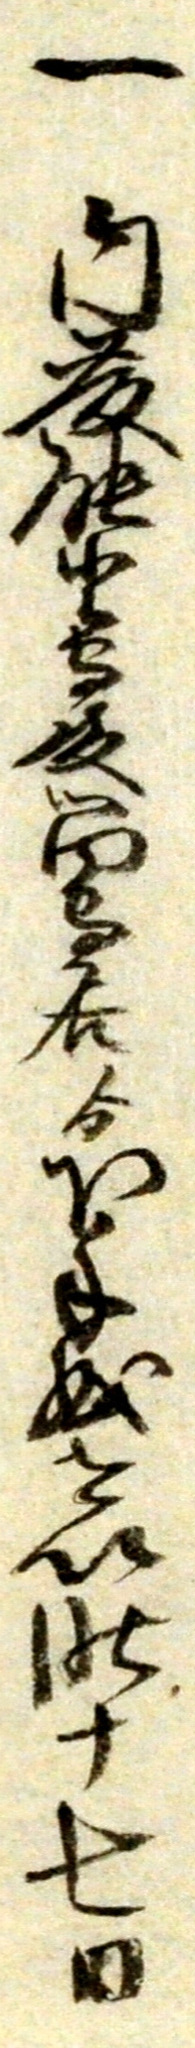一内藤能登守殿留守居ゟ下手紙を以昨十七日
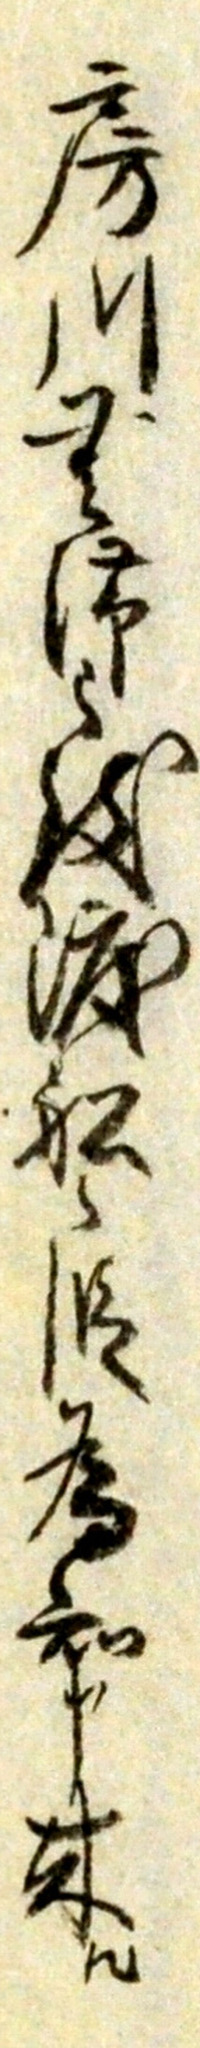房川無滞被致渡船之段為知申来ル
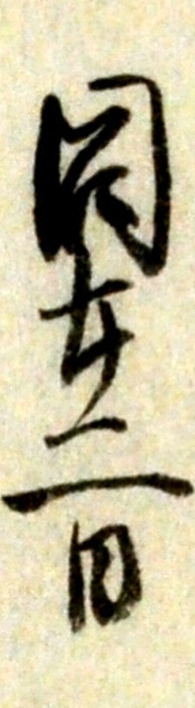同廿二日
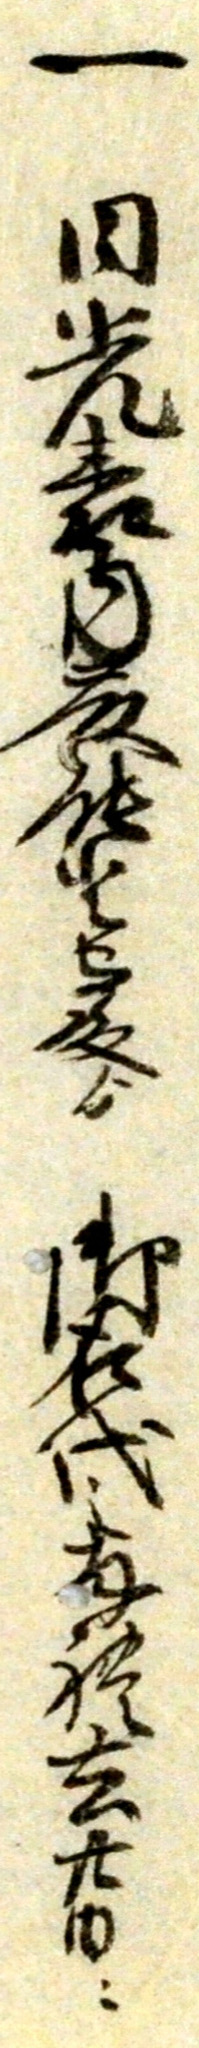一日光表内藤能登守殿ゟ御名代之拝礼去廿日ニ
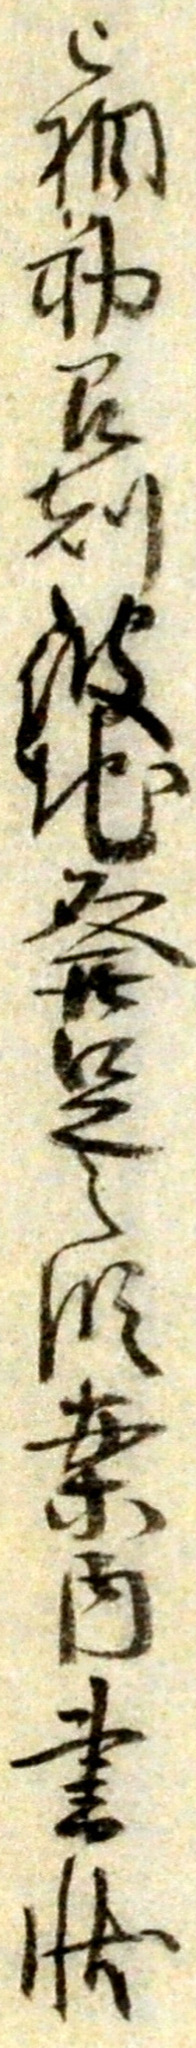被相勤即刻彼地発足之段案内書状
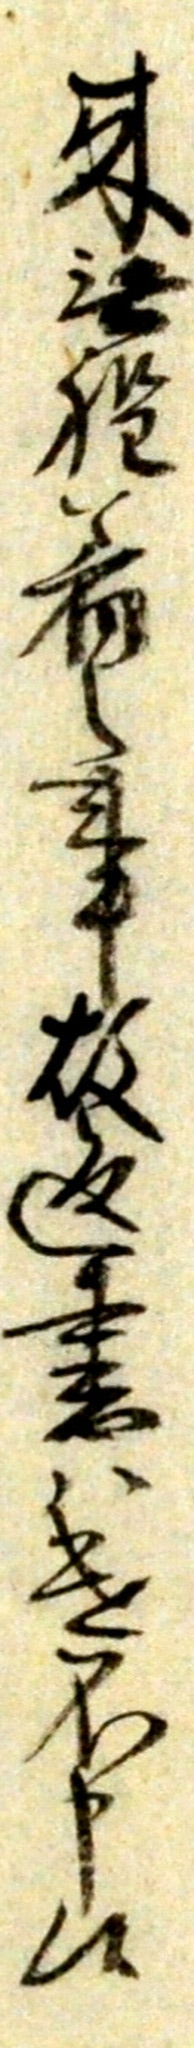来無程着之事故返書ハ遣不申候
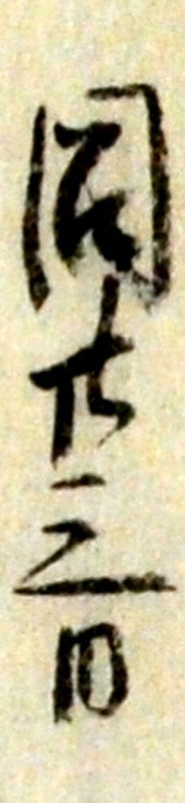同廿三日
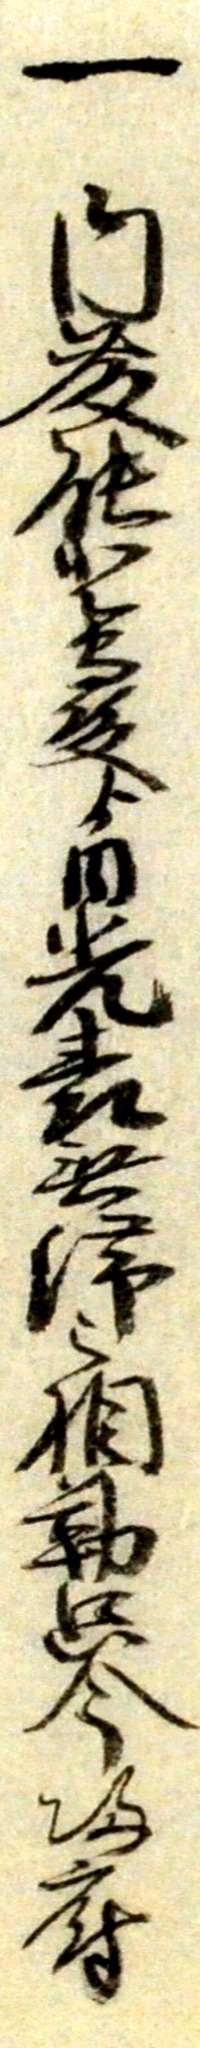一内藤能登守殿ゟ日光表無滞被相勤只今帰府
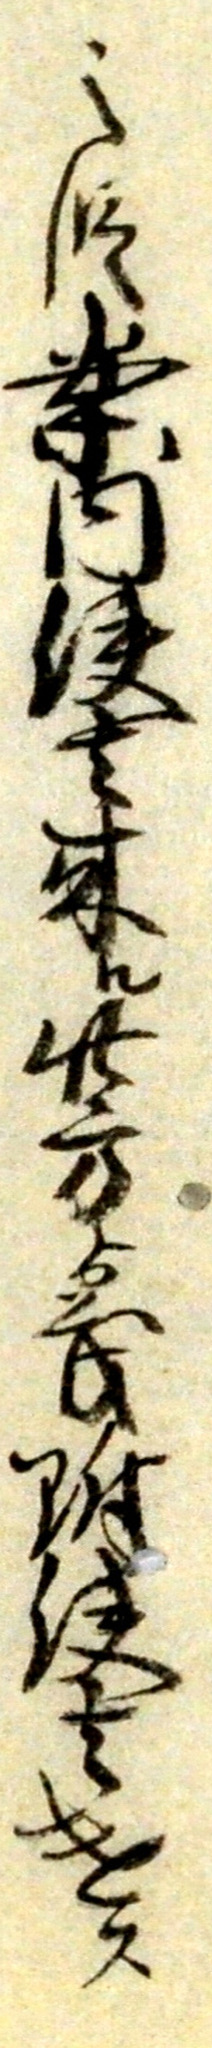之段案内使者来ㇽ此方ゟ茂附使者遣ス
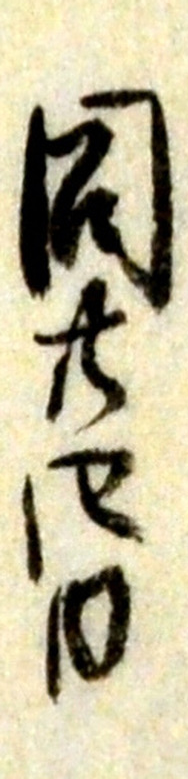同廿四日
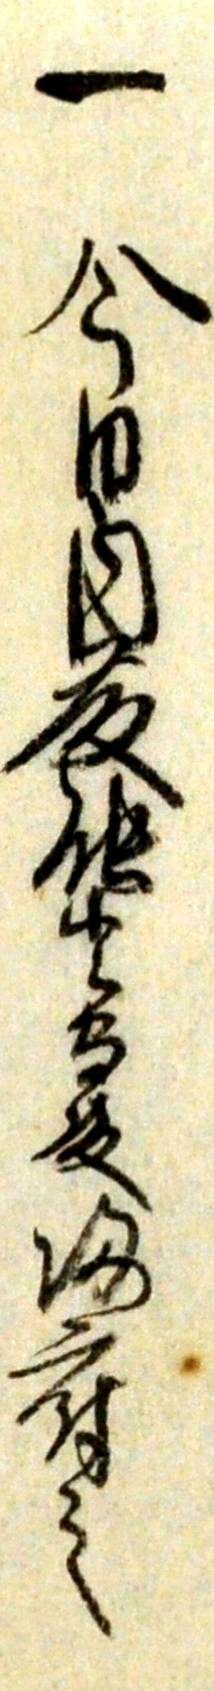一今日内藤能登守殿帰府之
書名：日光御名代相勤候節ノ留
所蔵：伊那市立高遠町図書館・合同会社AMANE
